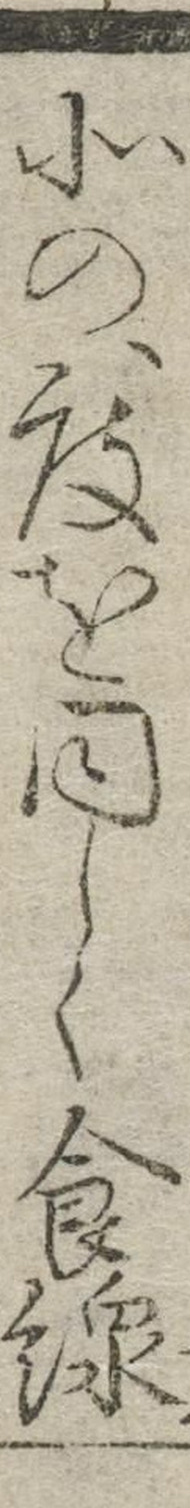北の度を同しく食線
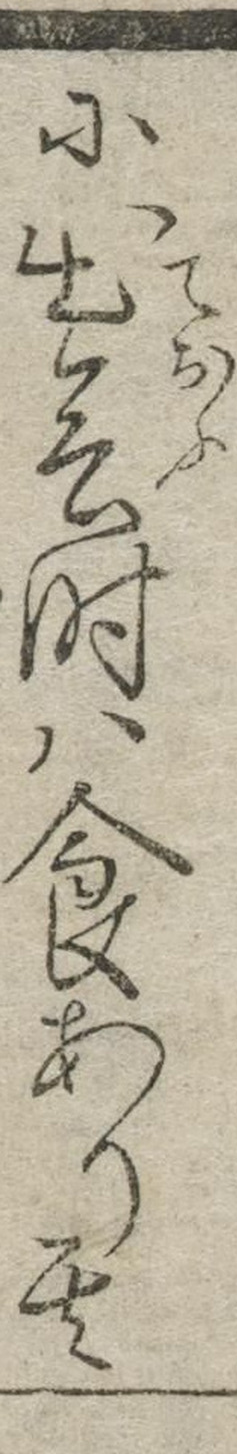に出会時は食あり其
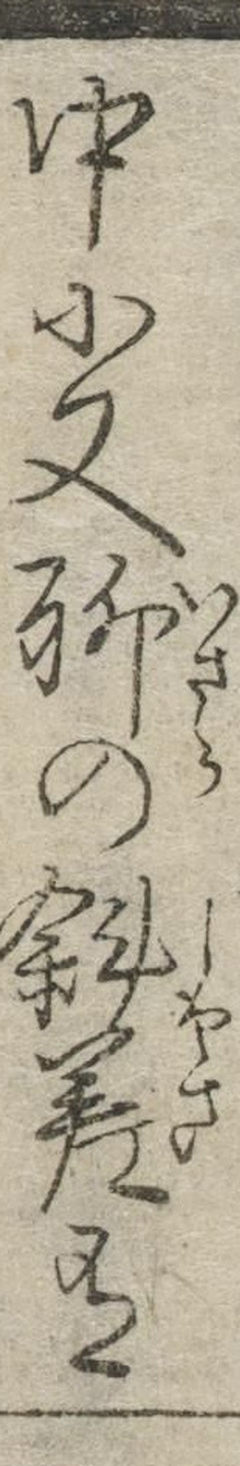中に又聊の斜差有
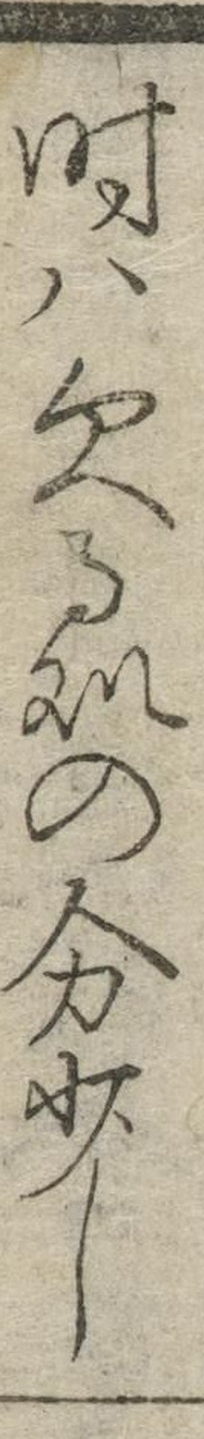時は欠る処の分少し

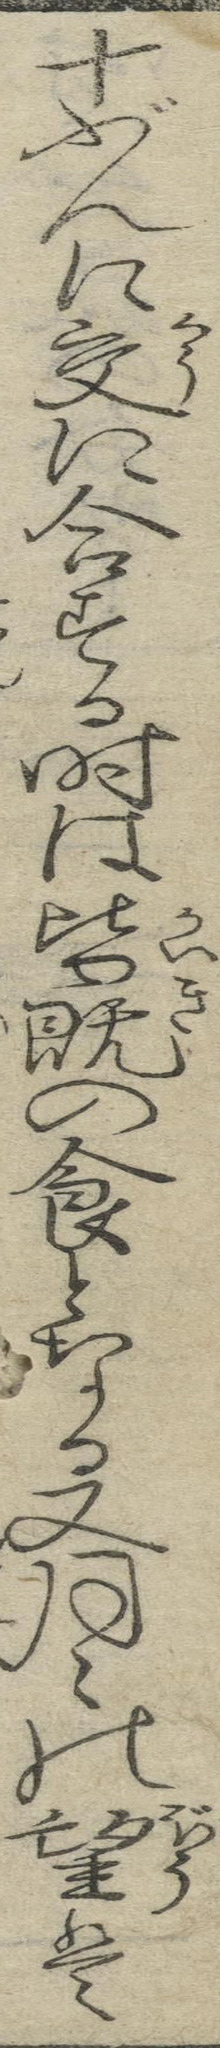十ぶんに交に合する時は皆既の食となる又月々の望は
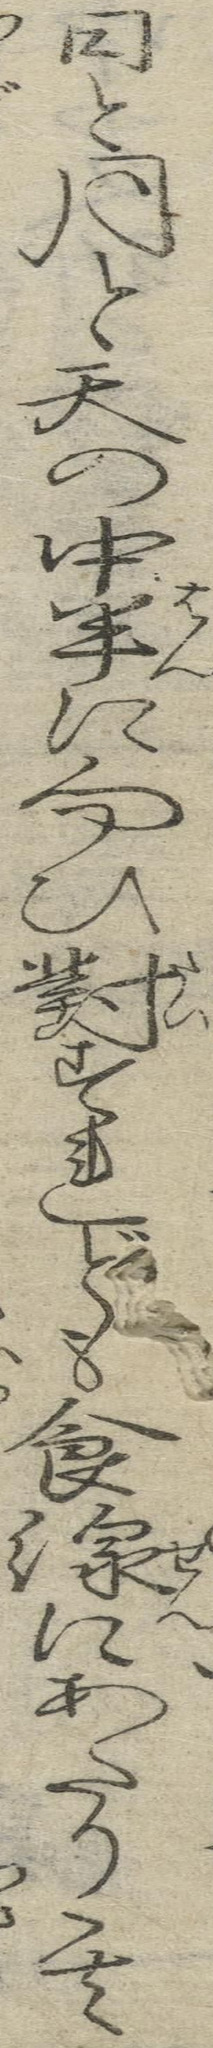日と月と天の中半に向ひ対すれども食線にあたり其
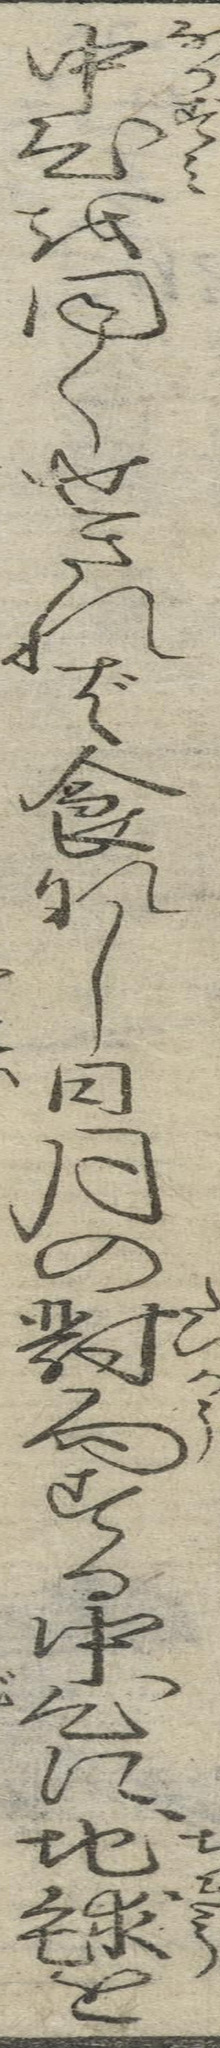中心を同くせされば食なし日月の対向する中心に地毬を
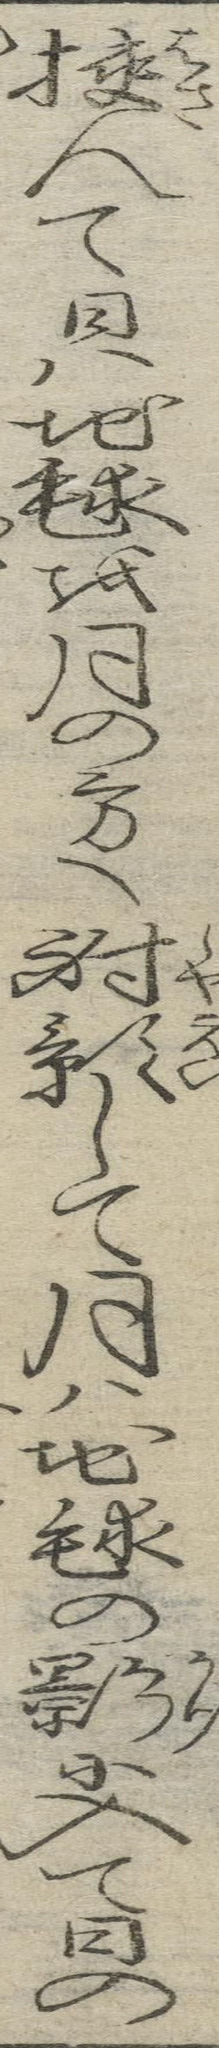挟んて日は地毬を月の方へ射影して月は地毬の影に入て日の
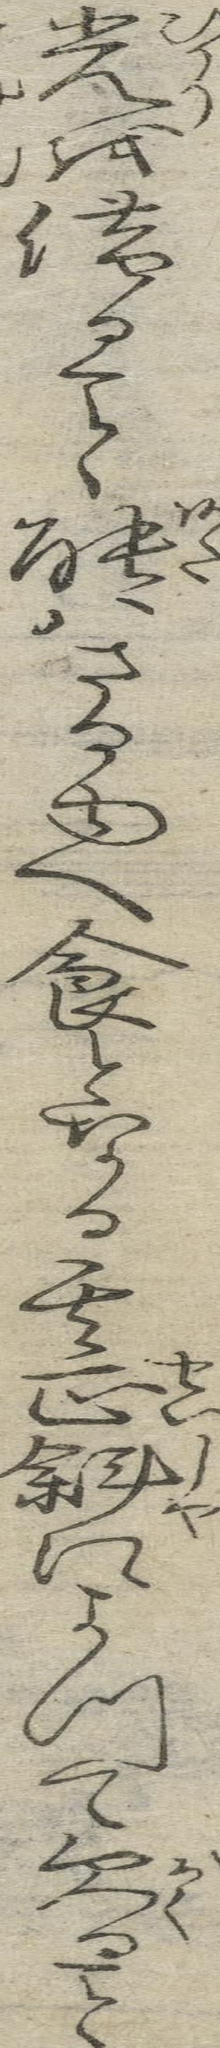光を借ること能はさるゆへ食となる其正斜によつて欠ること
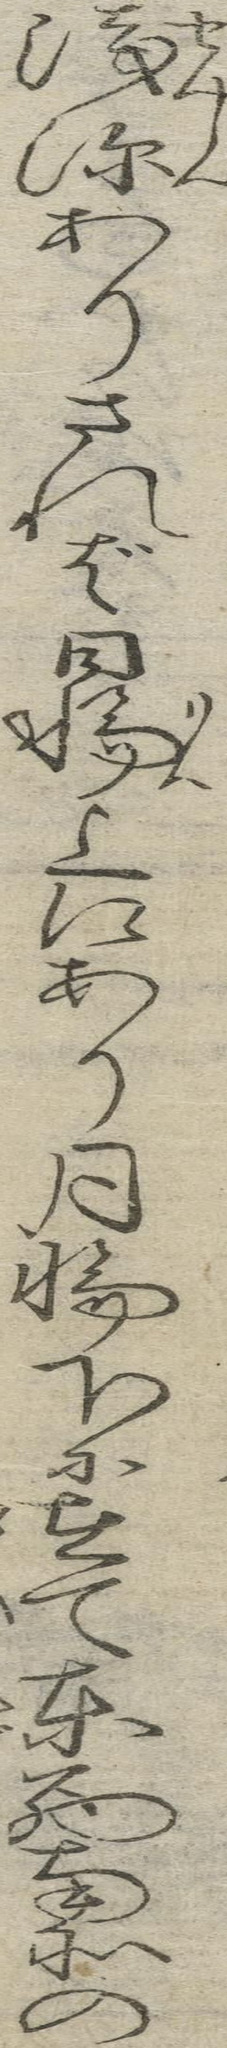浅深ありされば日輪上にあり月輪下に在て東西南北の
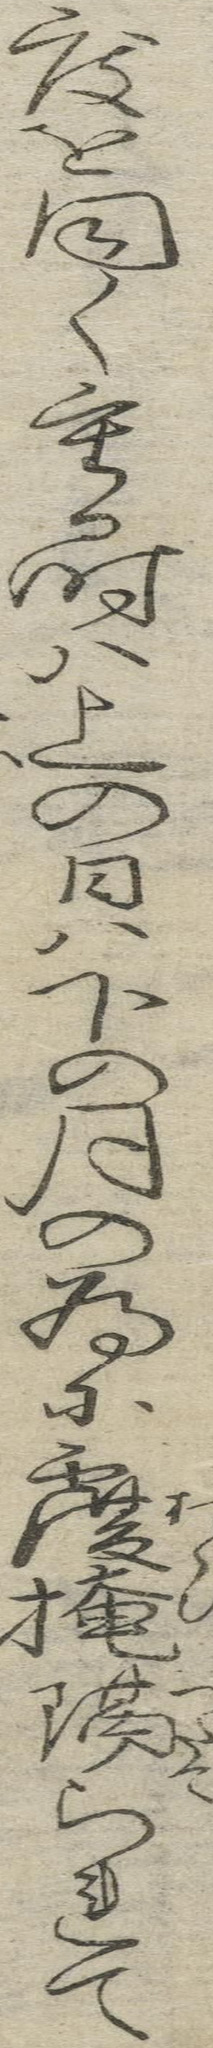度を同く重る時は上の日は下の月の為に覆掩隔られて
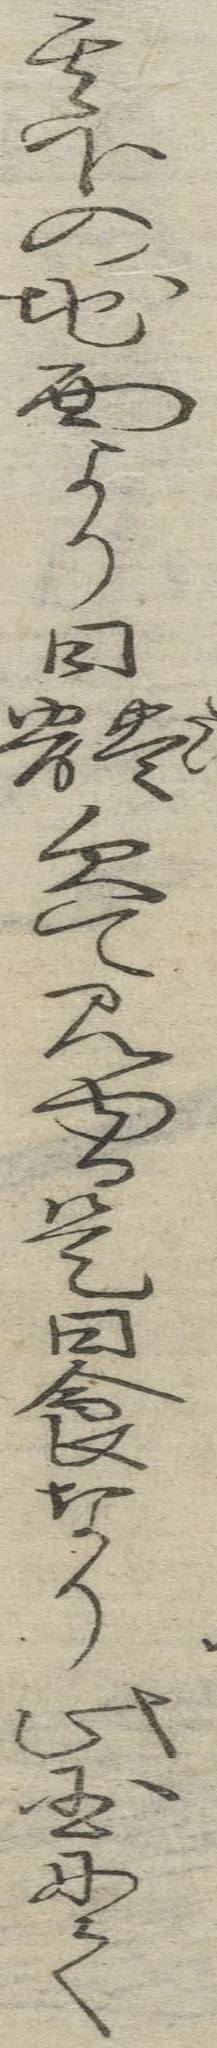其下の地面より日体欠て見ゆる是日食なり此国にて
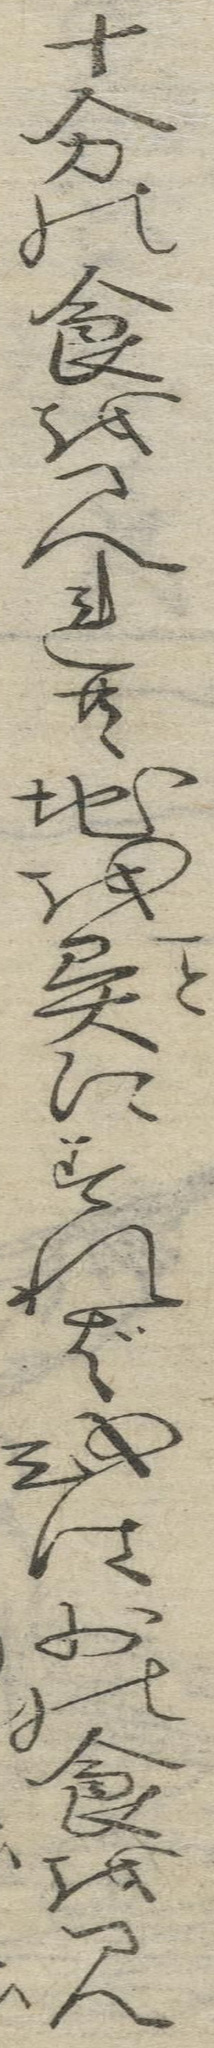十分の食をみれ共地を異にすれば或は少の食を見
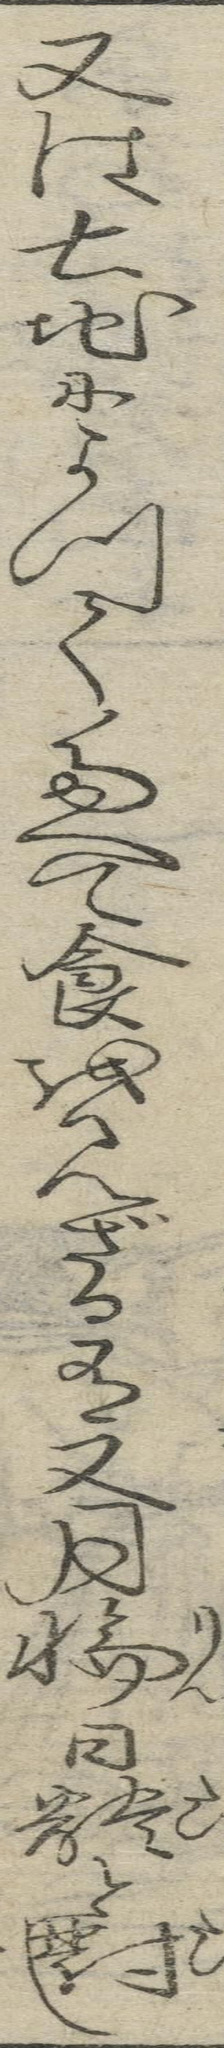又は土地によつてたへて食を見ざる有又月輪日体と対し
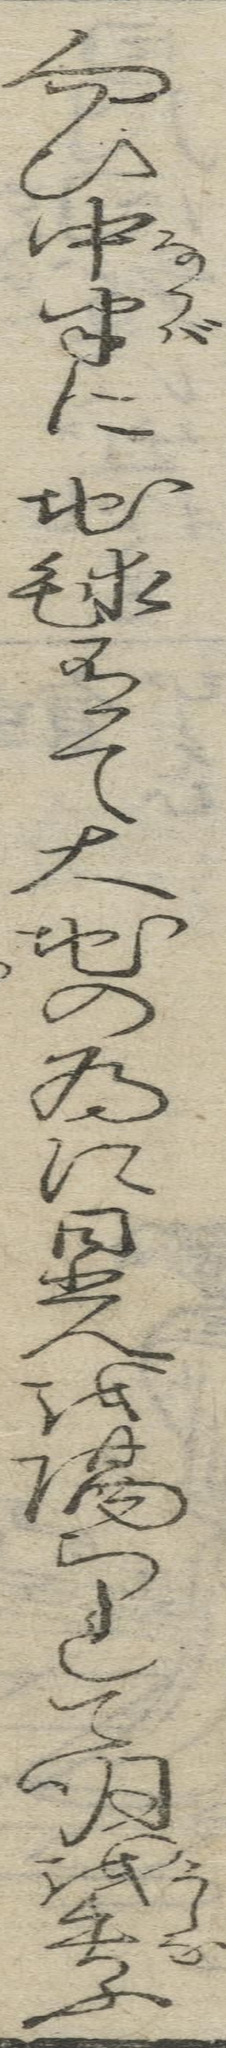向ひ中半に地毬有て大地の為に日光を隔られて明を失ふ
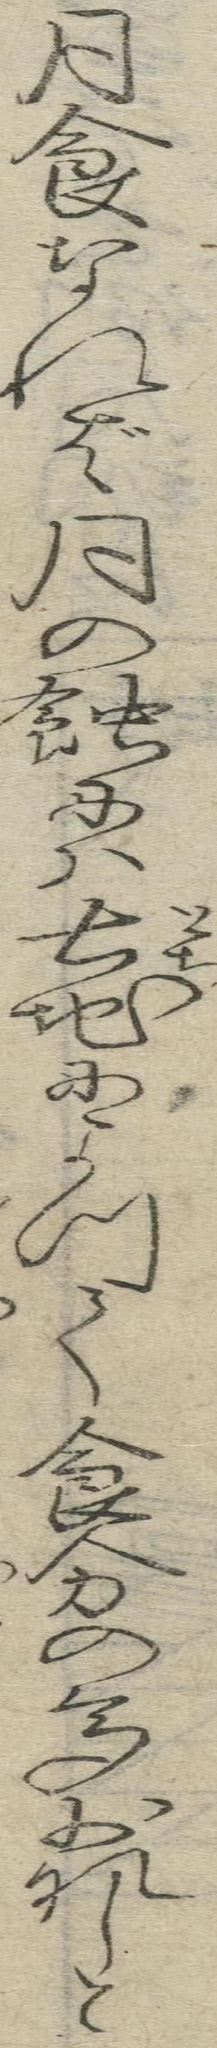月食なれば月の蝕には土地によつて食分の多少なしと
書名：訓蒙天地辨　天
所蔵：東京大学地震研究所図書室 Earthquake Research Institute Library, The University of Tokyo, JAPAN
